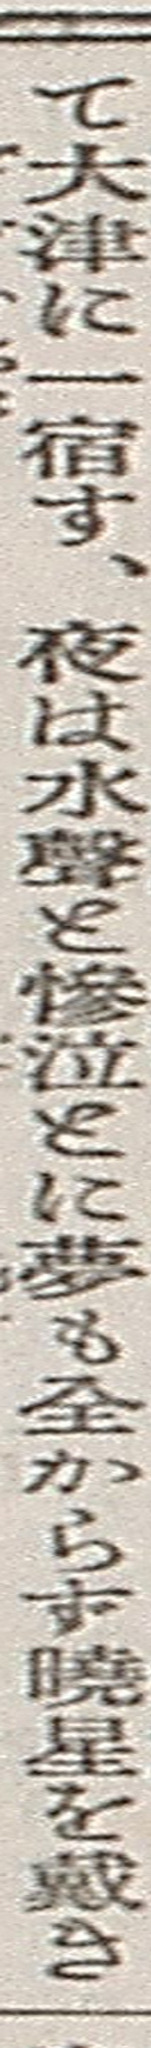て大津に一宿す、夜は水声と惨泣とに夢も同からず曉星を戴き
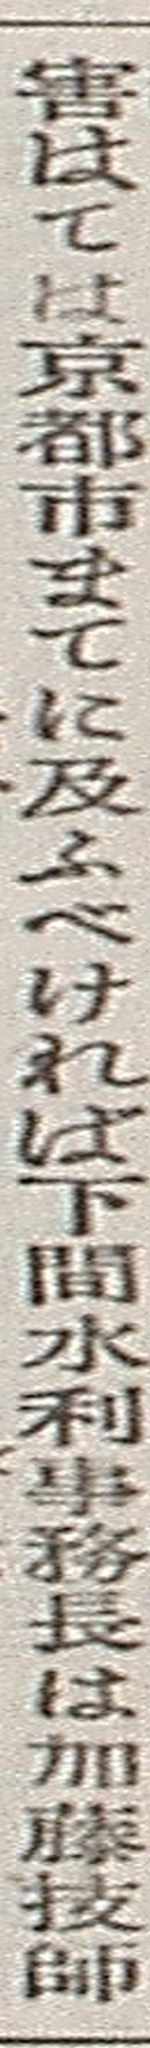害はては京都市までに及ふべければ下間水利事務長は加藤技師
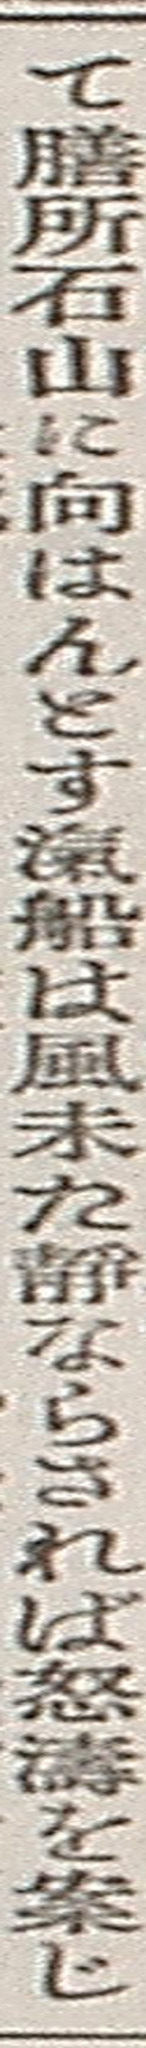て膳所石山に向はんとす汽船は風未だ静ならざれば怒濤を案じ
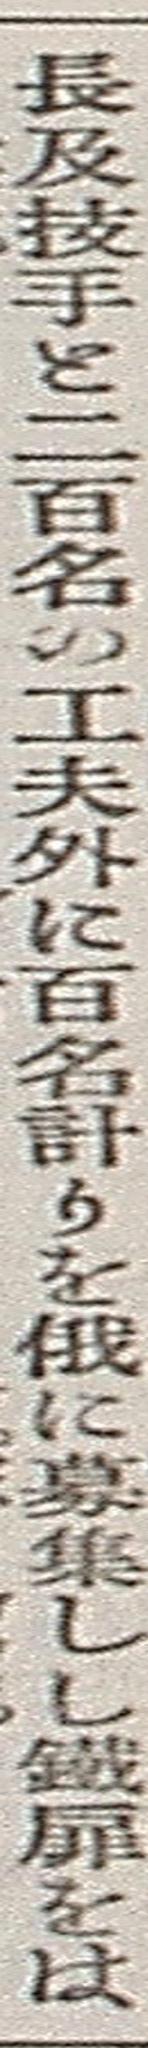長及技手と二百名の工夫外に百名計りを俄に募集しし鋨扉をは
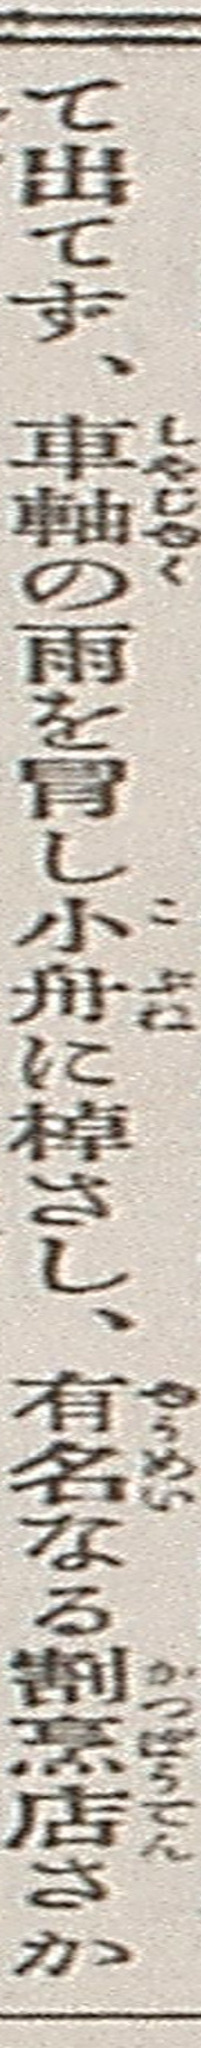て出てず、車軸の雨を冒し小舟に棹さし、有名なる割烹店さか
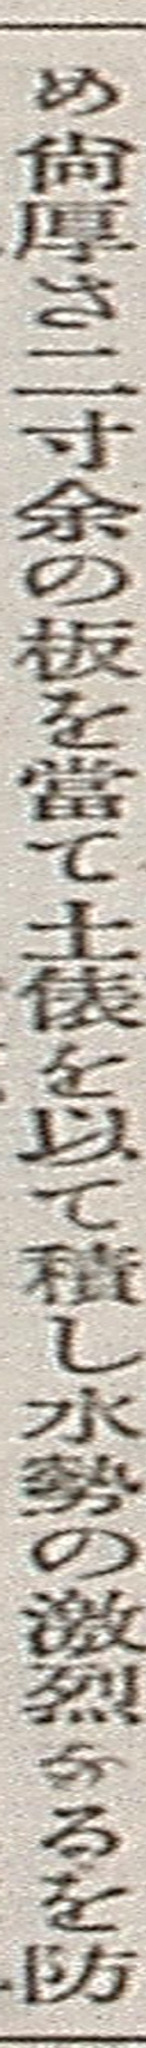め尚厚さ二寸余の板を当て土俵を以て積し水勢の激烈なるを防
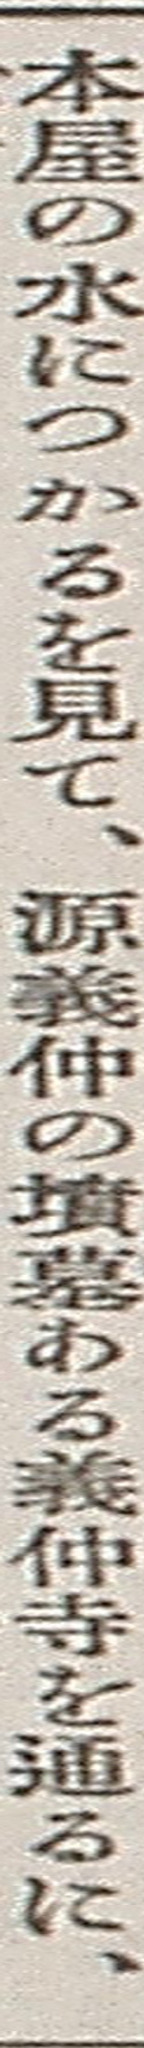本屋の水につかるを見て、源義仲の墳墓ある義仲寺を通るに、
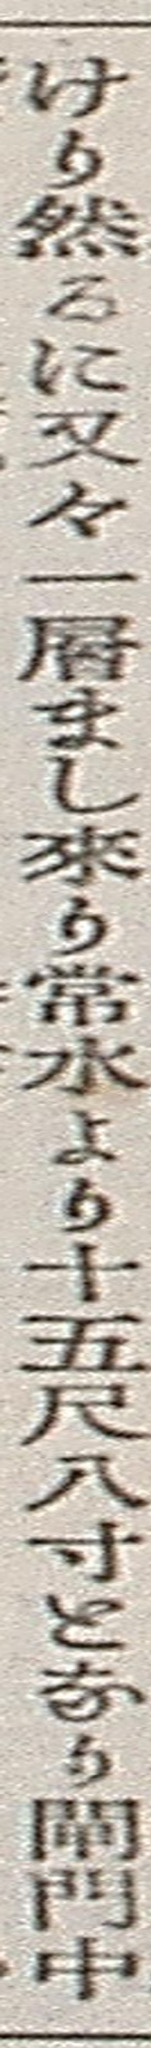けり然るに又々一層まし来り常水より十五尺八寸となり閘門中
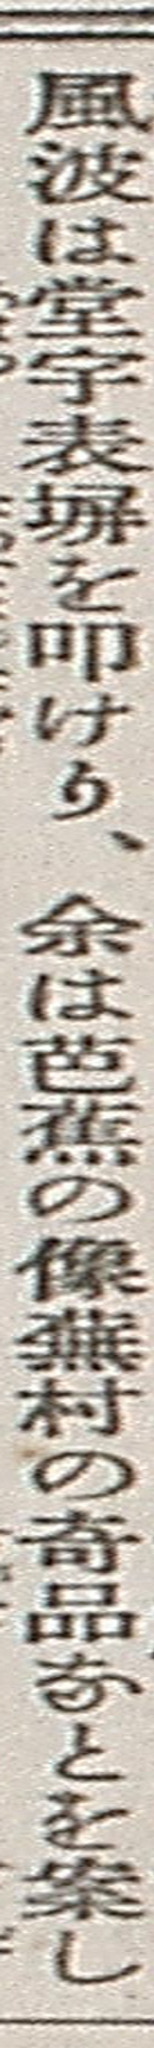風波は堂宇表塀を叩けり、余は芭蕉の像蕪村の奇品なとを案じ
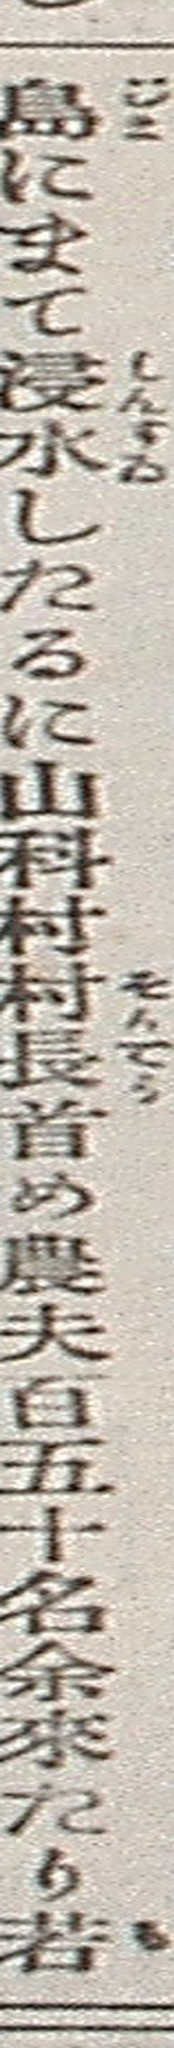島にまで浸水したるに山科村村長首め農夫百五十名余来たり若
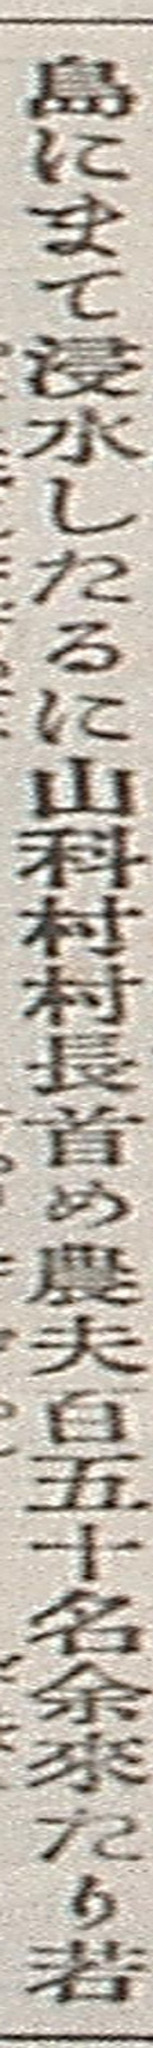島にまで浸水したるに山科村村長首め農夫百五十名余来たり若
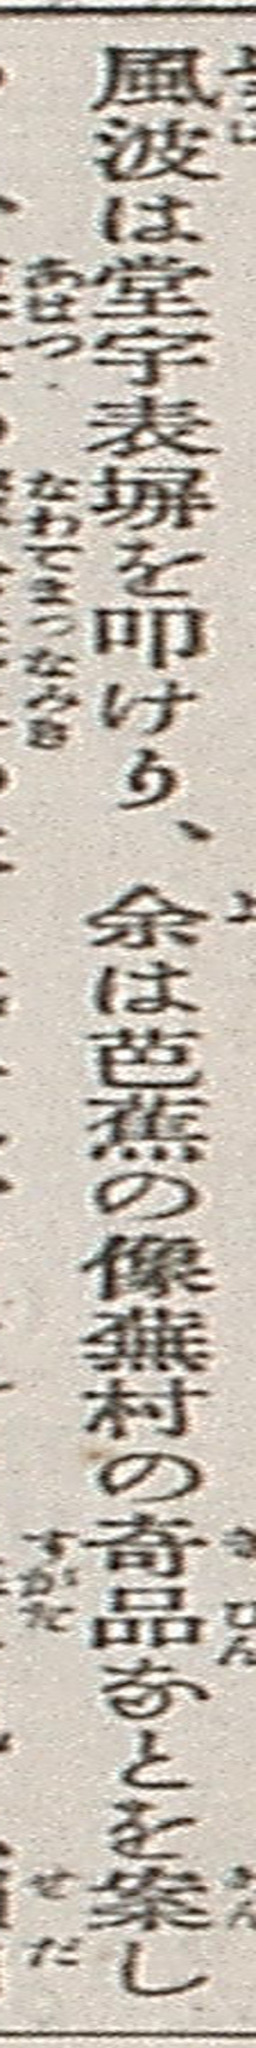風波は堂宇表塀を叩けり、余は芭蕉の像蕪村の奇品なとを案じ
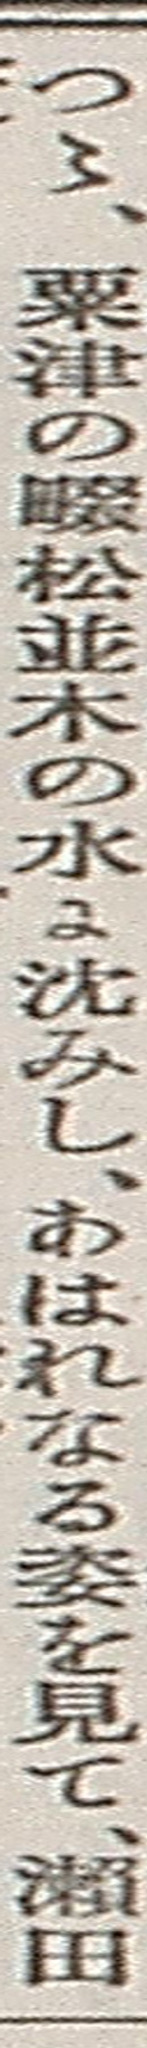つゝ、粟津の畷松並木の水に沈みし、あはれなる姿を見て、瀬田
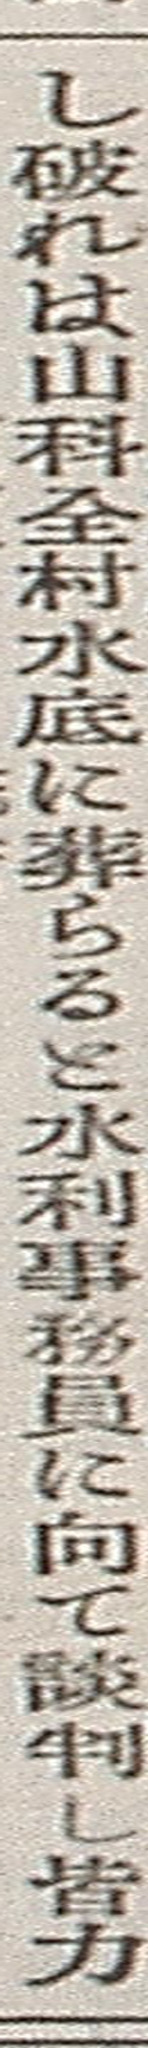し破れは山科全村水底に葬らると水利事務員に向て談判し皆力
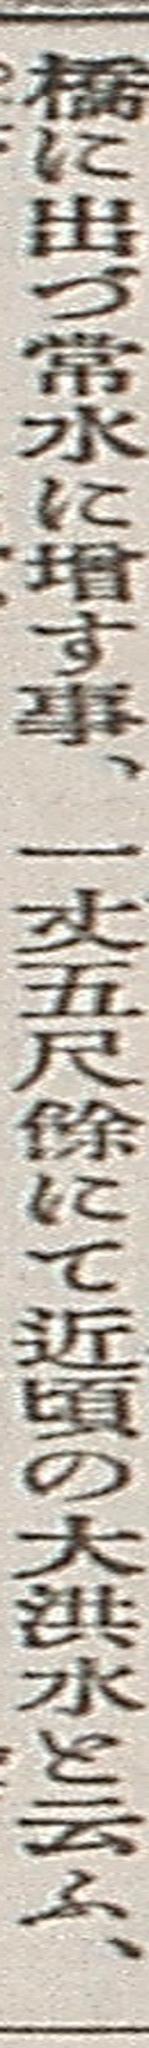橋に出づ常に増す事、一丈五尺餘にて近頃の大洪水と云ふ、
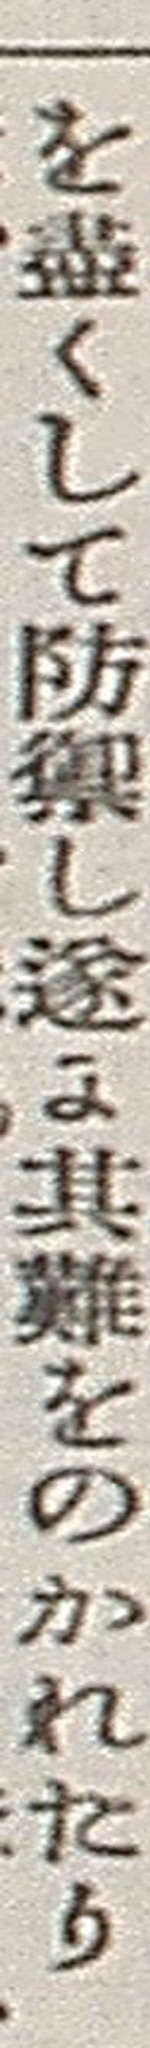を尽くして防禦し遂に其難をのかれたり
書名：風俗畫報臨時増刊第百二十八號　洪水被害録（下）
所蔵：東京大学地震研究所図書室 Earthquake Research Institute Library, The University of Tokyo, JAPAN
